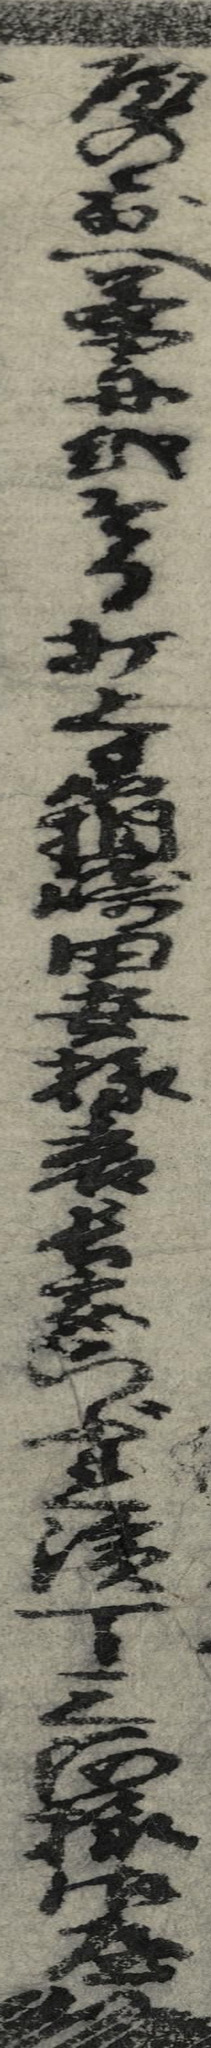屋の前へ茶舟弐そう打上る箱崎田安様表長屋門つぶれ湊丁三河様御屋
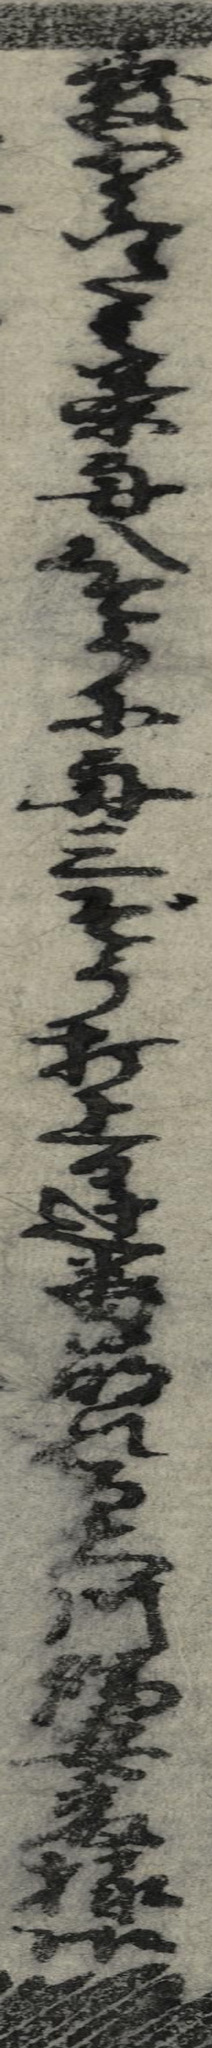敷少々いたみ茶舟八そう小舟三ぞう打上る辻番崩れる大川端安藤様御
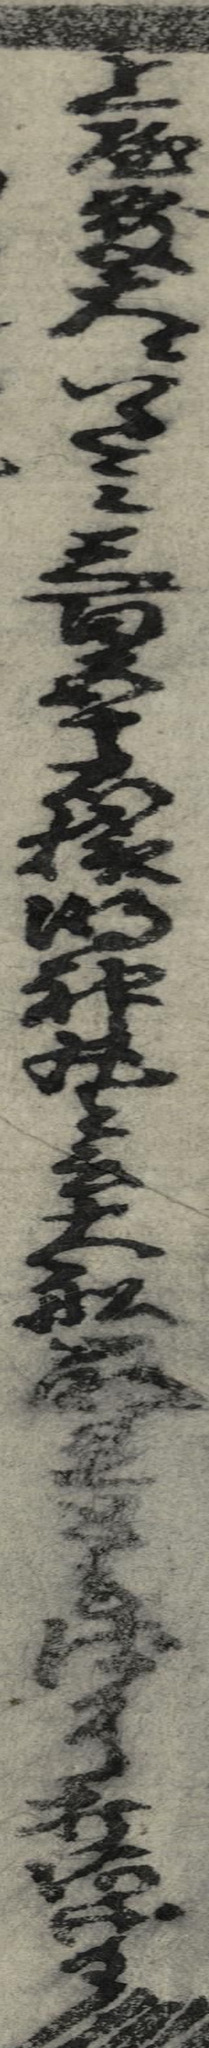上屋敷大にいたみ三百五十石積明神丸と云大船崩れともばかり打あげる
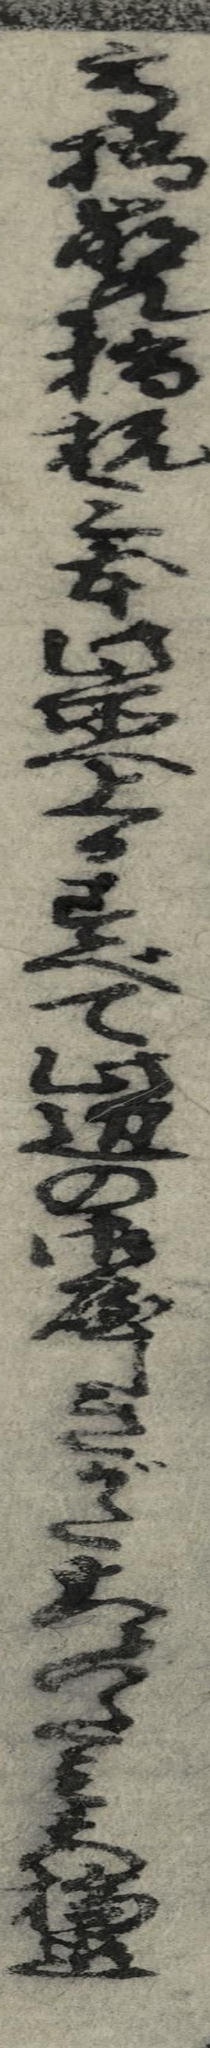高橋崩れ橋杭三本此所へ上るすべて此辺の御屋しきがた大にいたみ大橋辺
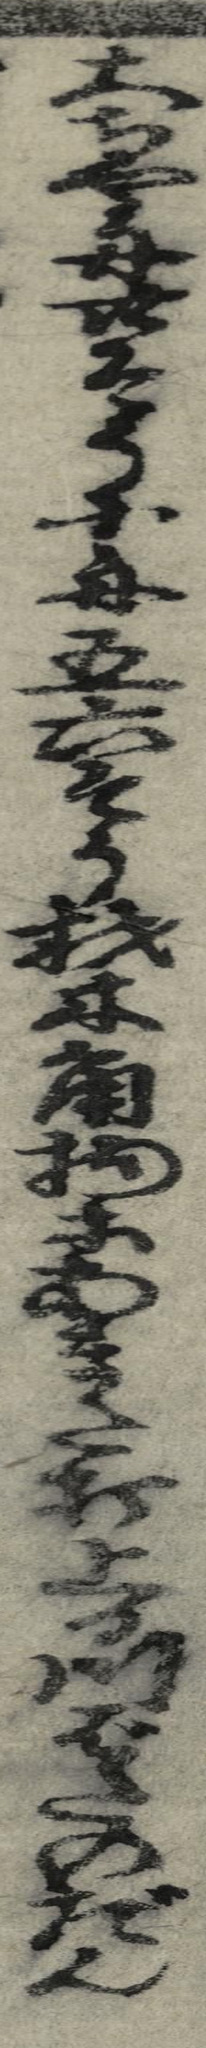大ちや舟廿そう小舟五六そう材木角物等あまた打上る川ばたのだん
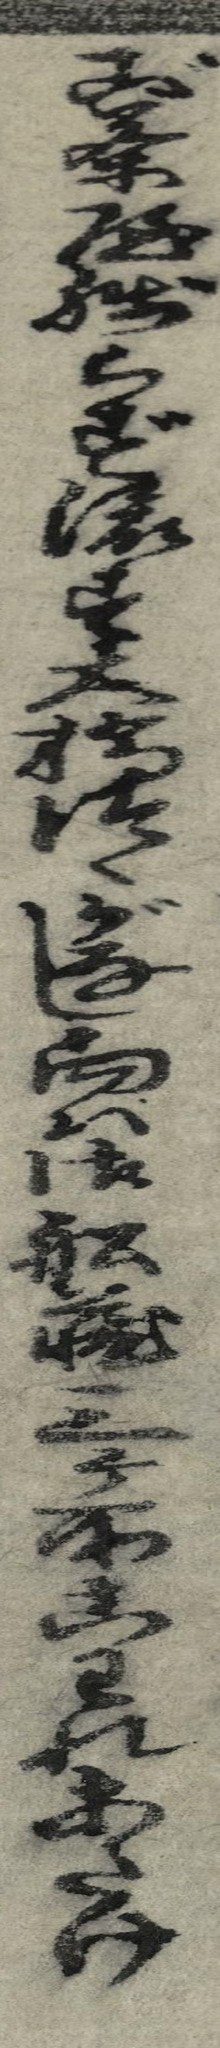ご茶屋残らずつぶれ大橋つゝがなし向は御船蔵三ヶ所こわれあたけ
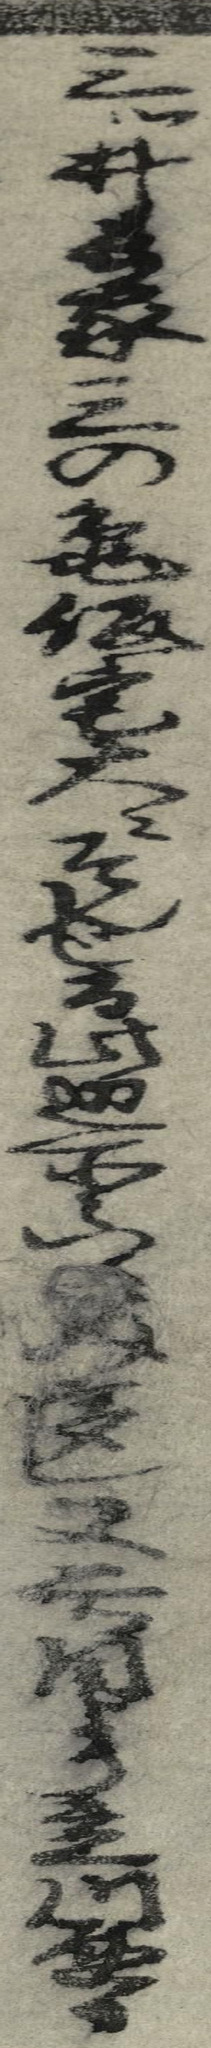三ッ井長家三の亀仮宅大にそんじる此辺所々いたみ多し又二ッ目より立川通り
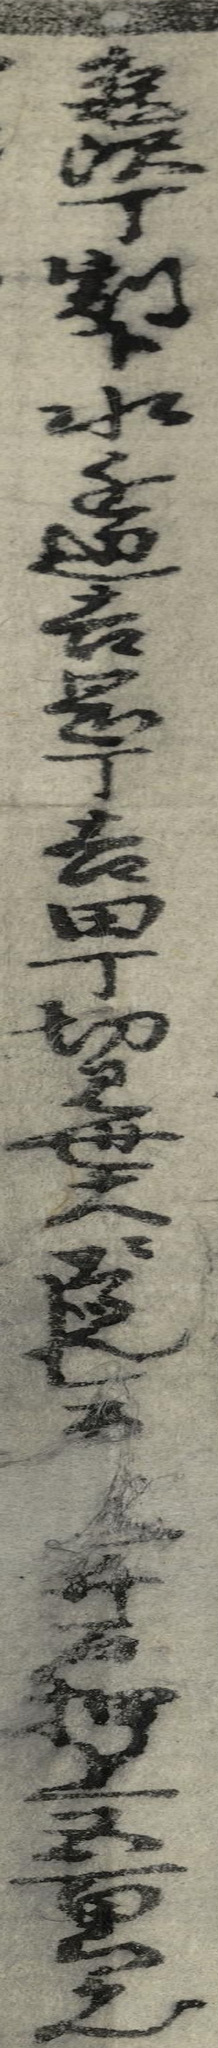亀沢丁割下水近辺吉岡丁吉田丁切見世大にそんじる亀井戸押上五百らかん
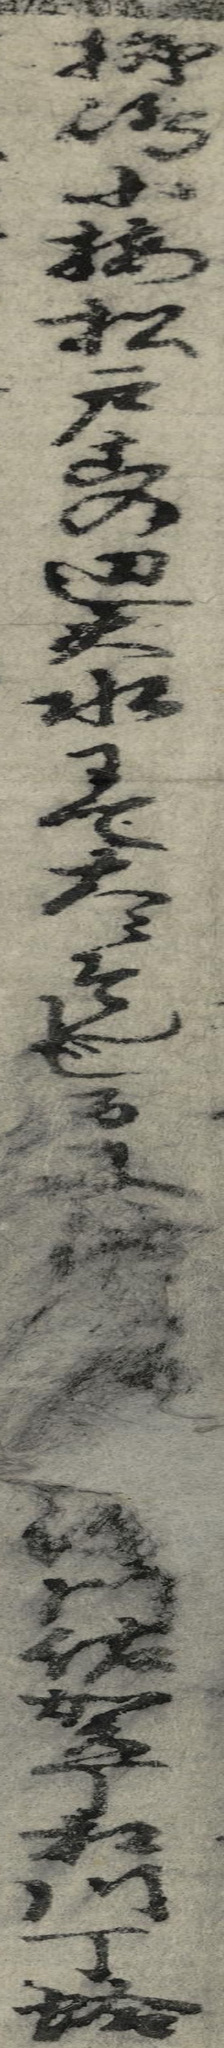柳嶋小梅松戸この辺大水にて大にそんじる又永代橋向は深川佐賀丁松川丁蛤
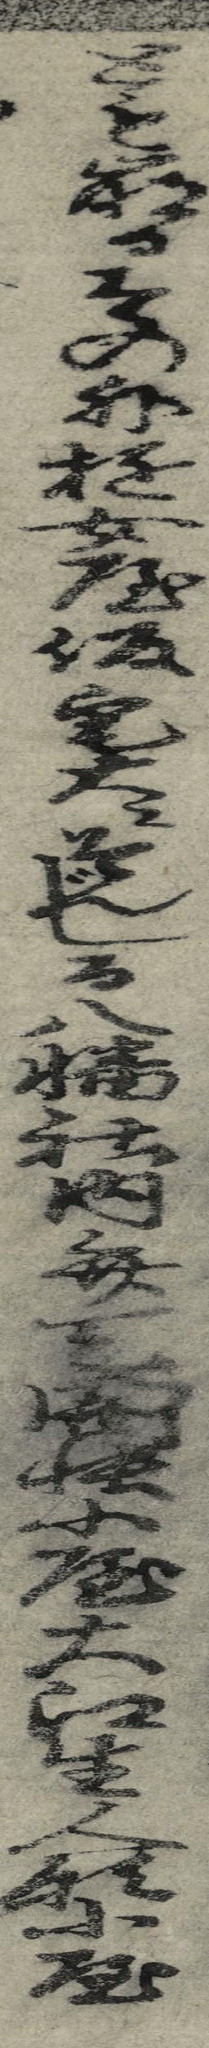とも崩るその外遊女屋仮宅大にそんじる八幡社内弁天開帳小屋大江生人形小屋
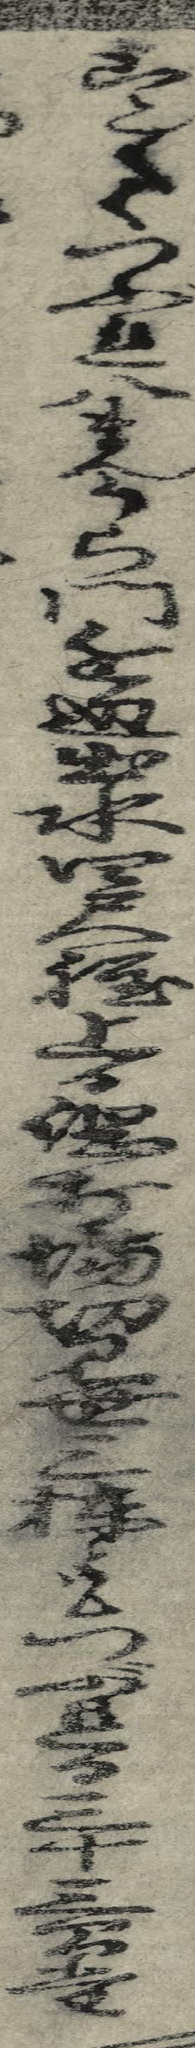こと〴〵くつぶれ八まんうら門近出水四尺程上る網打場切見世三棟ともつぶれる三十三間寺
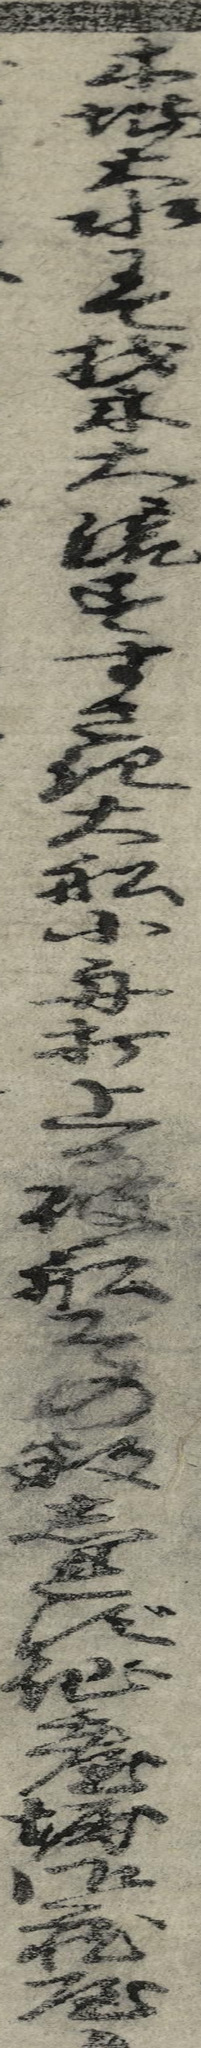木場大水にて材木大に流すすさき大船小舟打上る破船その数しらず仙台堀御蔵屋
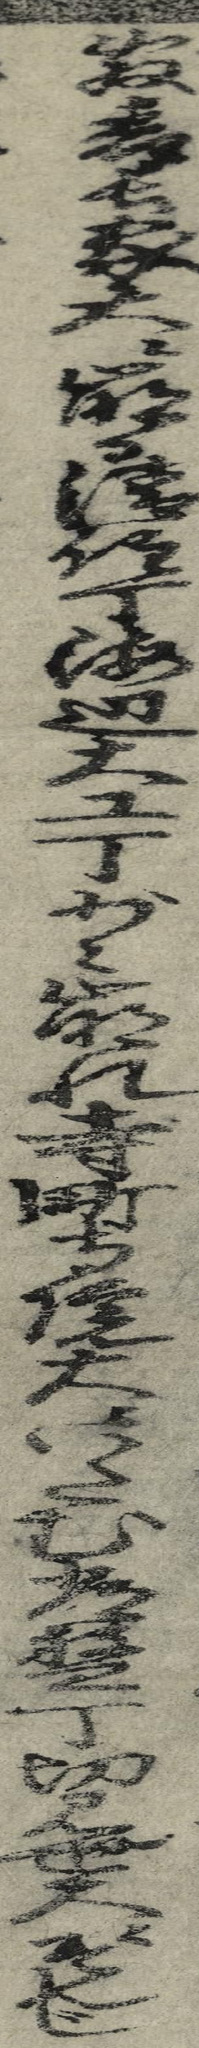敷表長屋大に崩る清住町海辺大工町少々崩れ寺町寺院大にいたむ常盤丁切見世大にそんじ
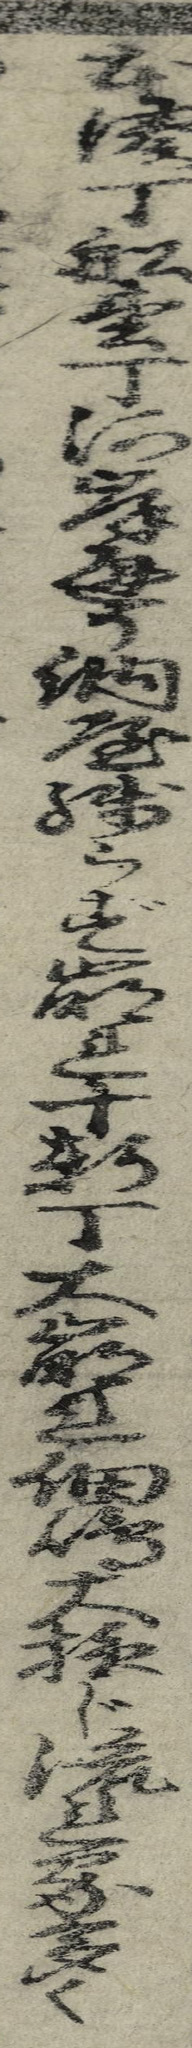本湊丁船松丁河岸通り納屋残らず崩れ十軒丁大崩れ佃嶋大損じ流れ家多く
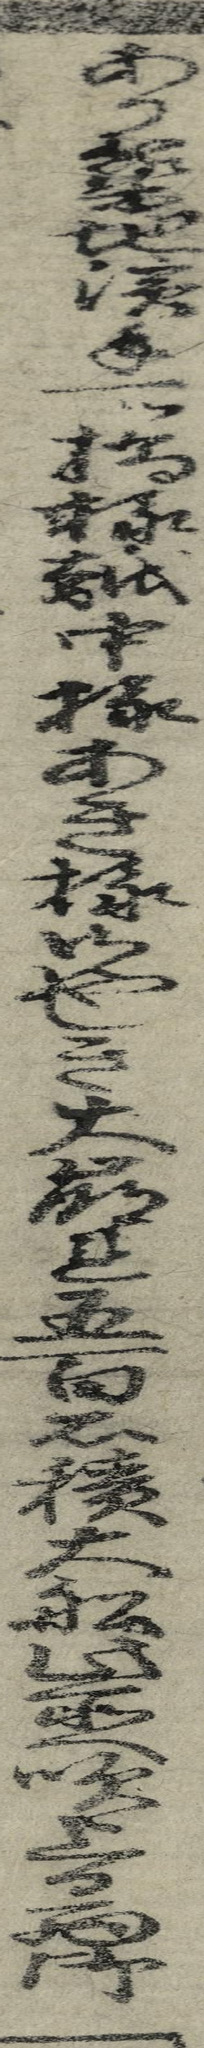あり築地濱手一ッ橋様越中様あき様御やしき大崩れ五百石積大船此所へ吹上る西御
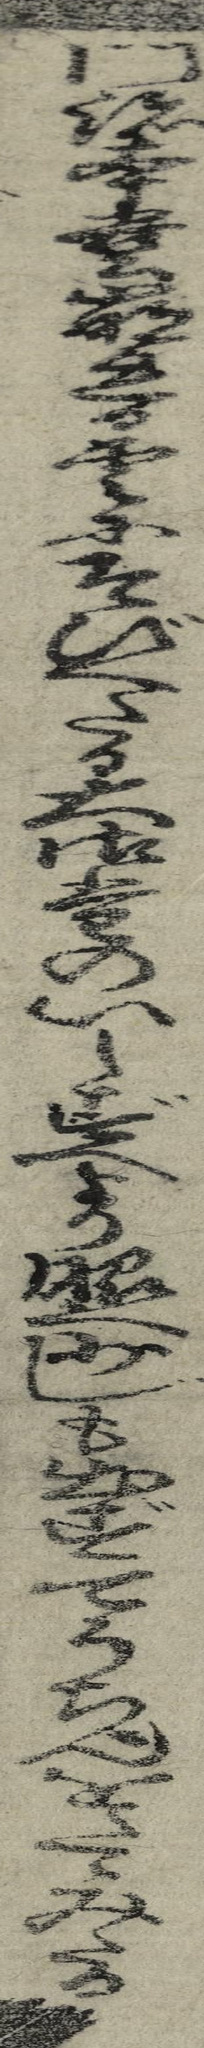門跡本堂崩れる雲にそびへたる大御堂のいしずへより脇へ少しも出ずてうちんをたゝみたる
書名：安政三辰八月廿五日　大風雨出水損場所之圖
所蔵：東京大学地震研究所図書室 Earthquake Research Institute Library, The University of Tokyo, JAPAN
